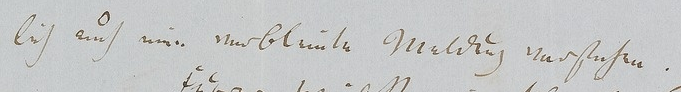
lich auch eine verblümte Meldung verstehen.
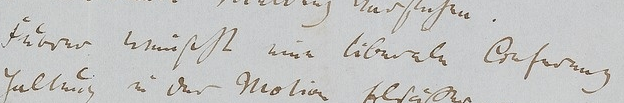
Furrer wünscht eine liberale Conferenz
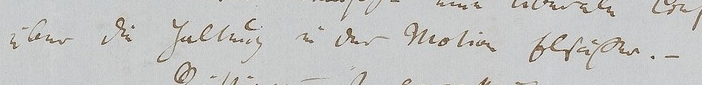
über die Haltung in der Motion Elsäßer. –
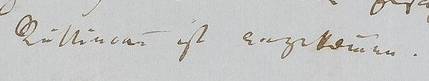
Rüttimann ist angekommen.
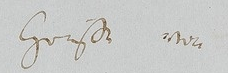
Grüße von
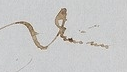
Deinem
